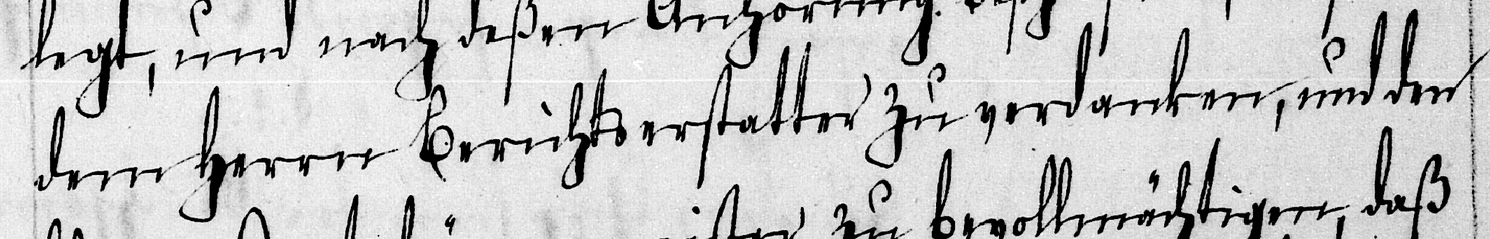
dem Herrn Berichtserstatter zu verdanken, und den
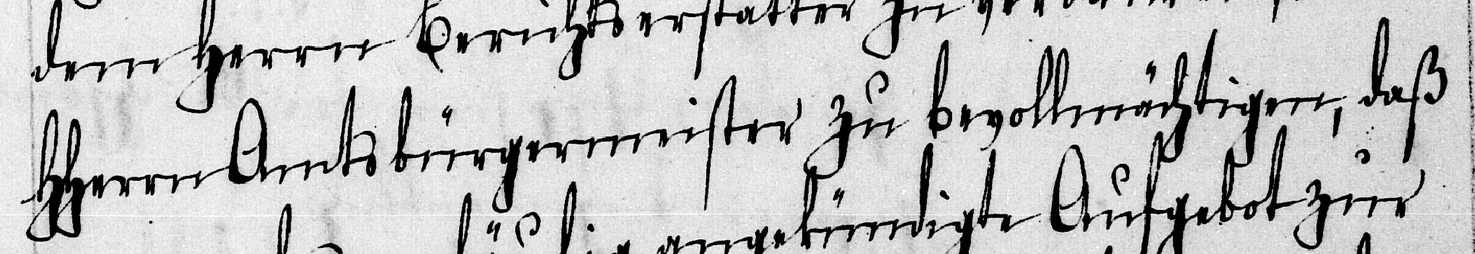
HHerrn Amtsbürgermeister zu bevollmächtigen, daß
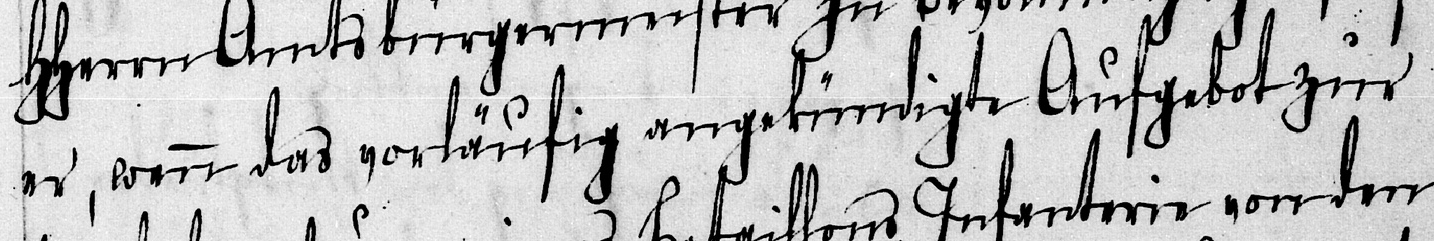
er, wenn das vorläufig angekündigte Aufgebot zur
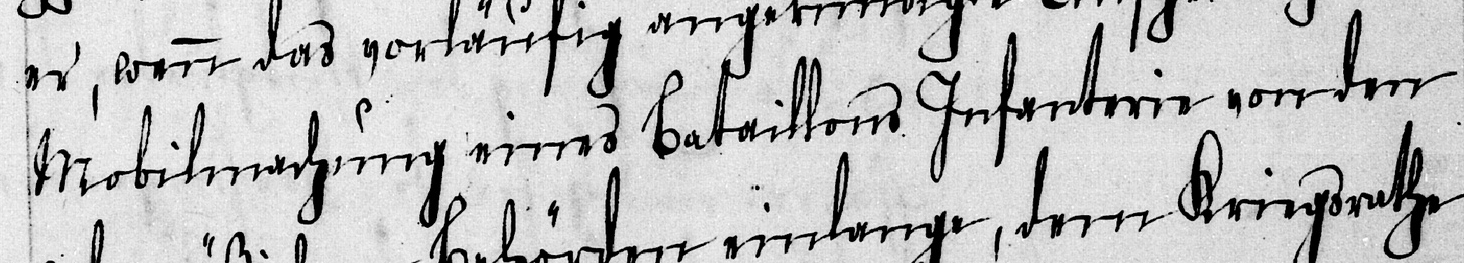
Mobilmachung eines Bataillons Infanterie von den
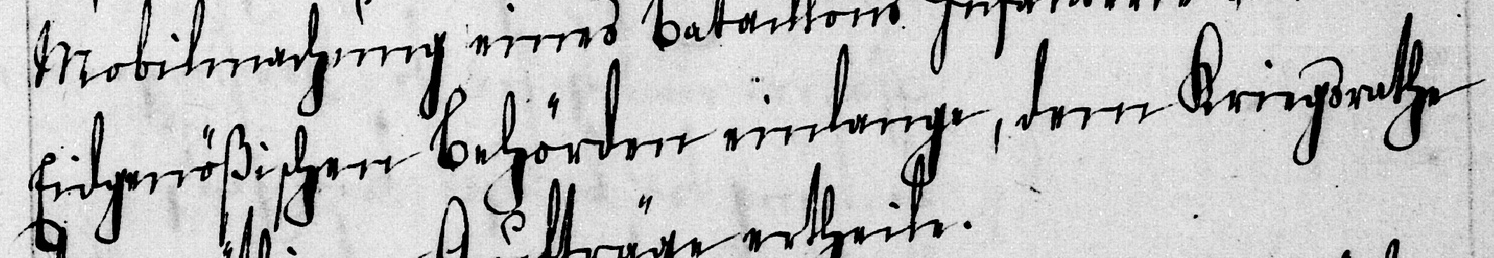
Eidgenößischen Behörden einlange, dem Kriegsrathe
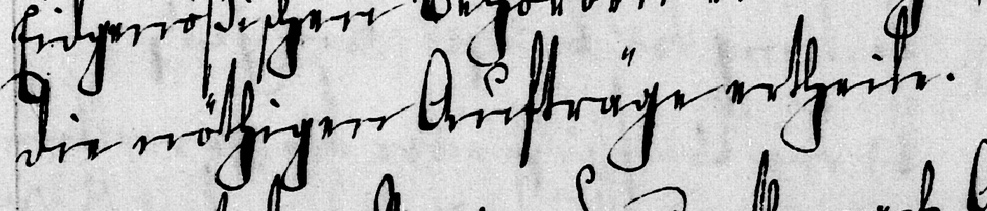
die nöthigen Aufträge ertheile.
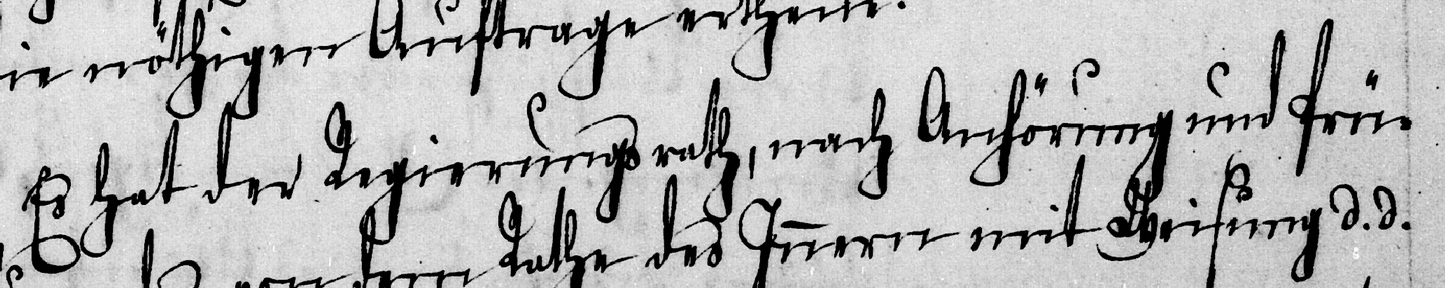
Es hat der Regierungsrath, nach Anhörung und Prü¬
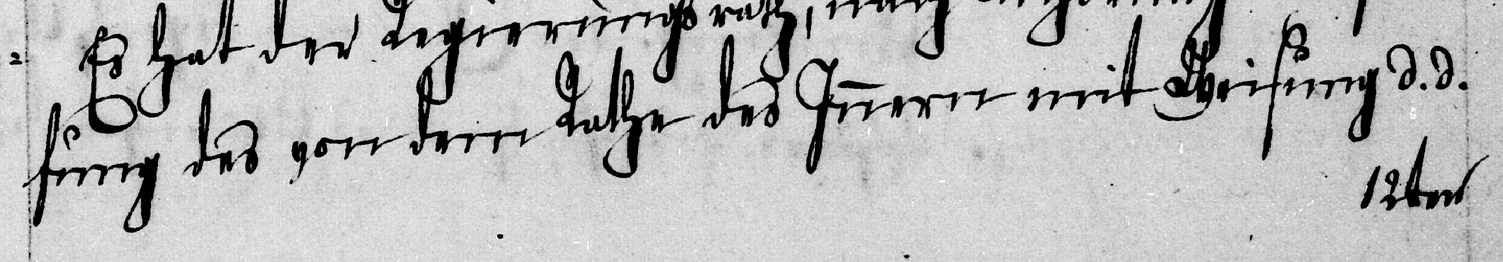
fung des von dem Rathe des Innern mit Weisung d. d.
